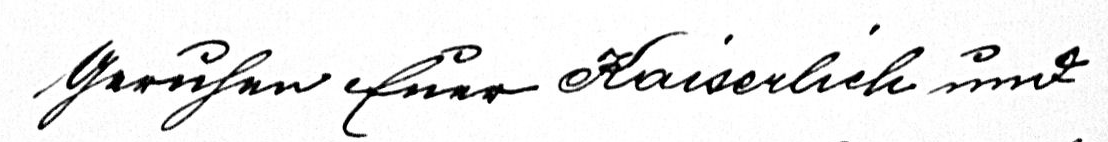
Geruhen Euer Kaiserlich und
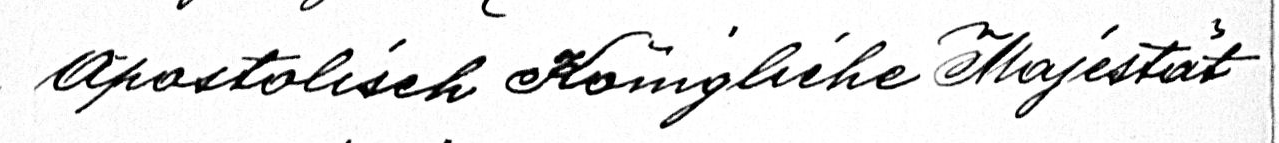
Apostolisch Königliche Majestät
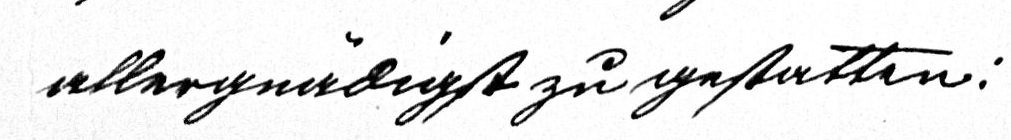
allergnädigst zu gestatten:
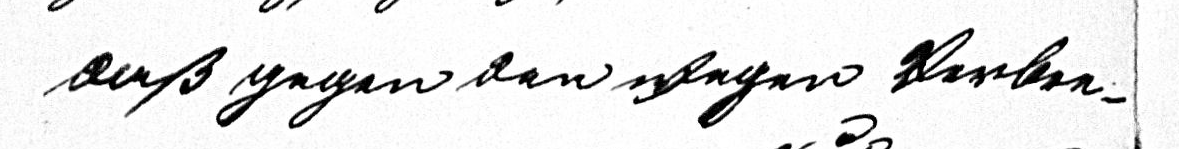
Daß gegen den wegen Verbre¬
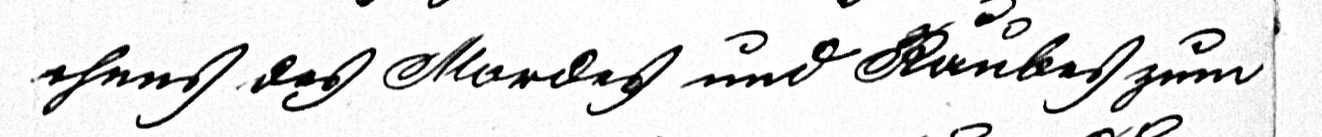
chens des Mordes und Raubes zum
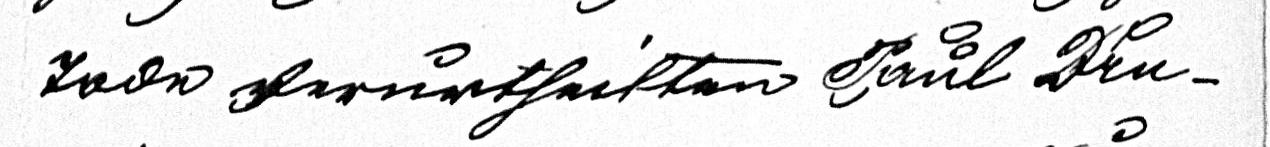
Tode verurtheilten Paul Dru¬
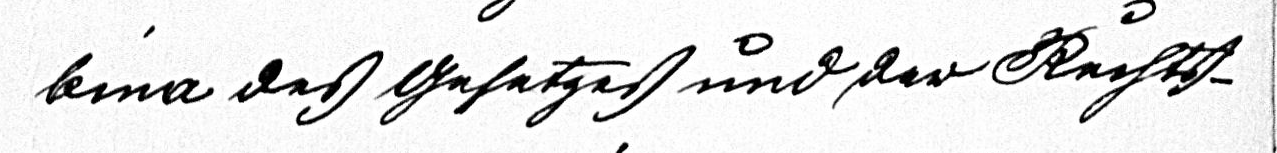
bina des Gesetzes und der Rechts¬
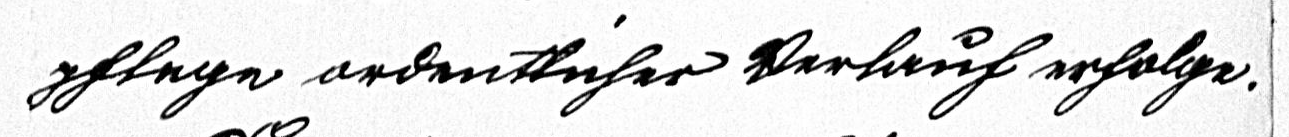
pflege ordentlicher Verlauf erfolge.
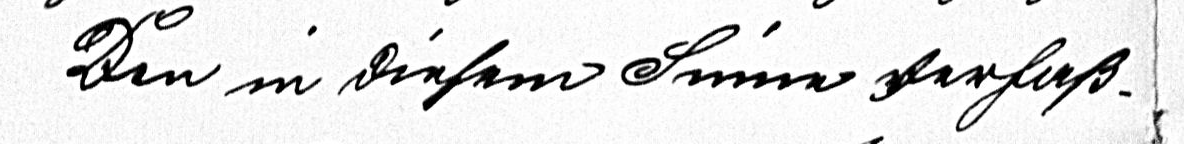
Den in diesem Sinne verfaß¬
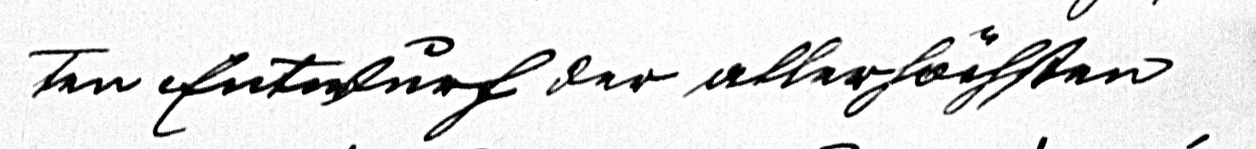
ten Entwurf der allerhöchsten
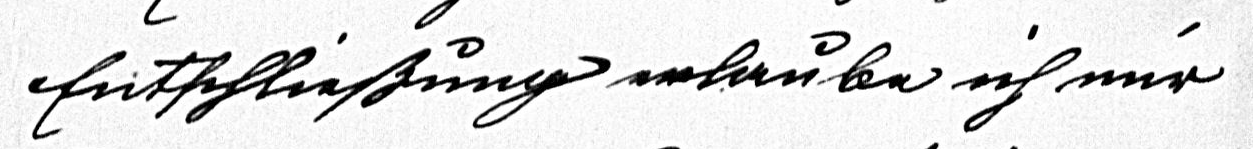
Entschließung erlaube ich mir
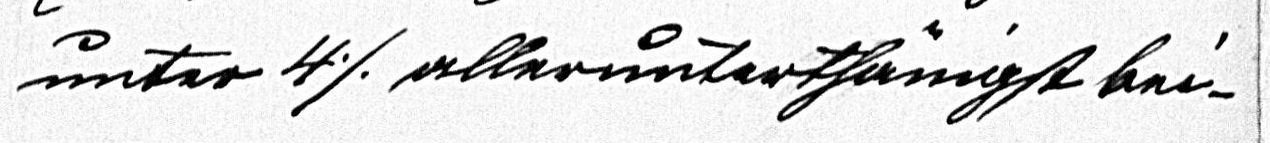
unter 4./. allerunterthänigst bei¬
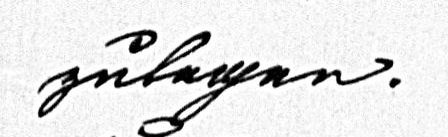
zulegen.
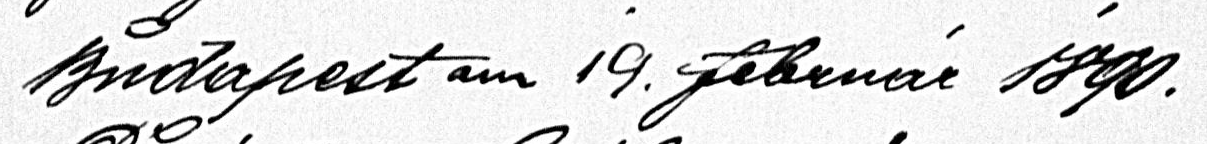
Budapest am 19. Februar 1890.
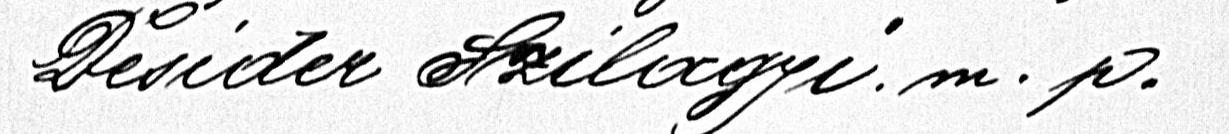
Desider Szilagyi. m. p.
